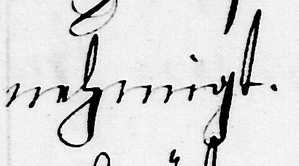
nehmigt.
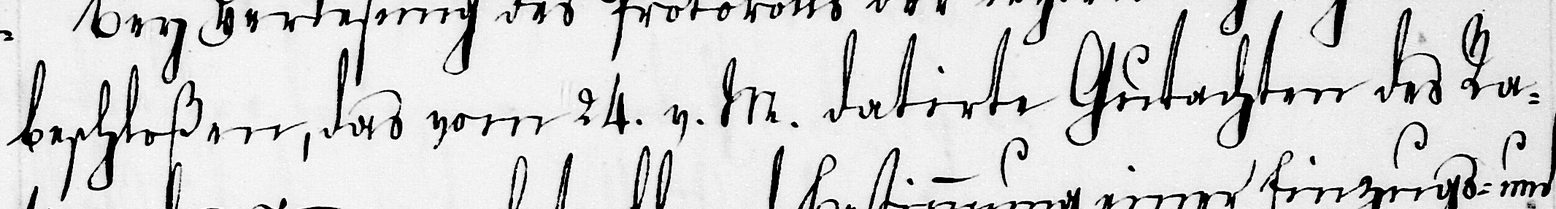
beschloßen, das vom 24. v. M. datirte Gutachten des Ra¬
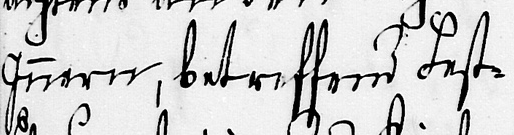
Innern betreffend Best¬
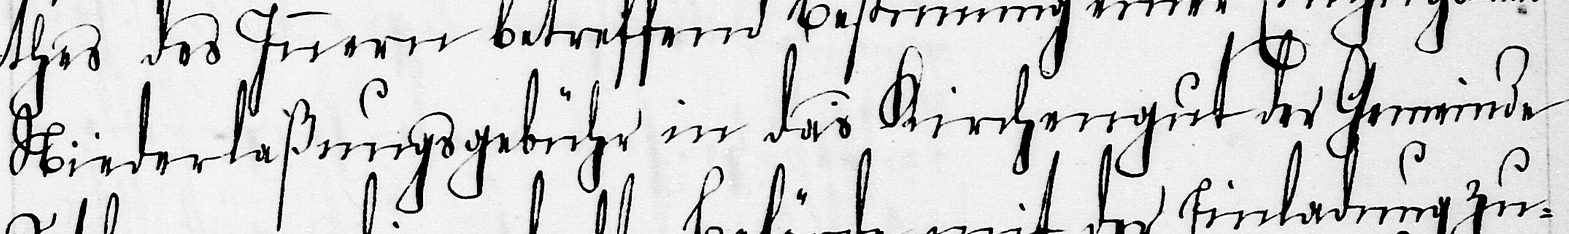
Niederlaßungsgebühr in das Kirchengut der Gemeinde
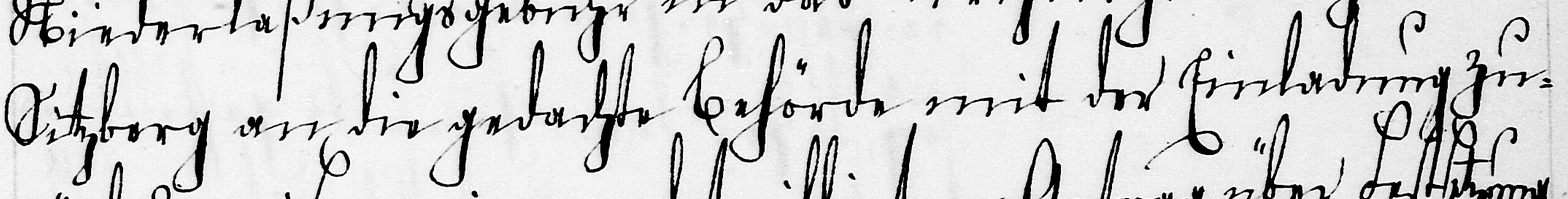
Sitzberg an die gedachte Behörde mit der Einladung zu¬
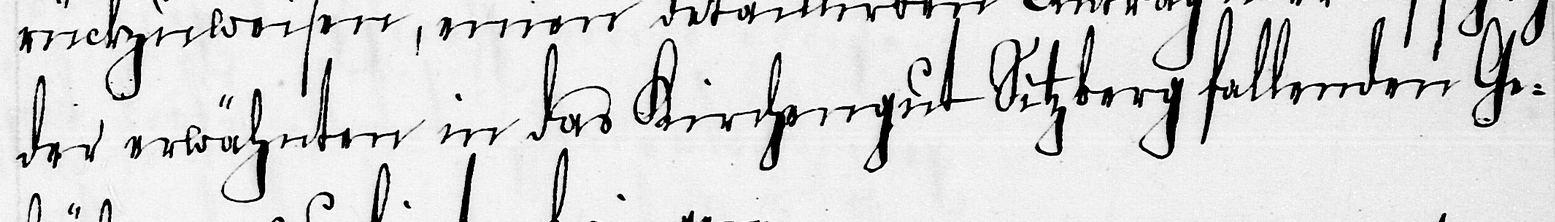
der erwähnten in das Kirchengut Sitzberg fallenden Ge¬
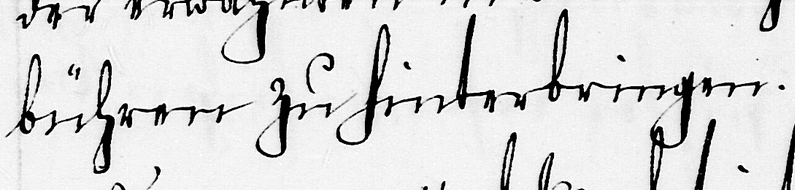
bühren zu hinterbringen.
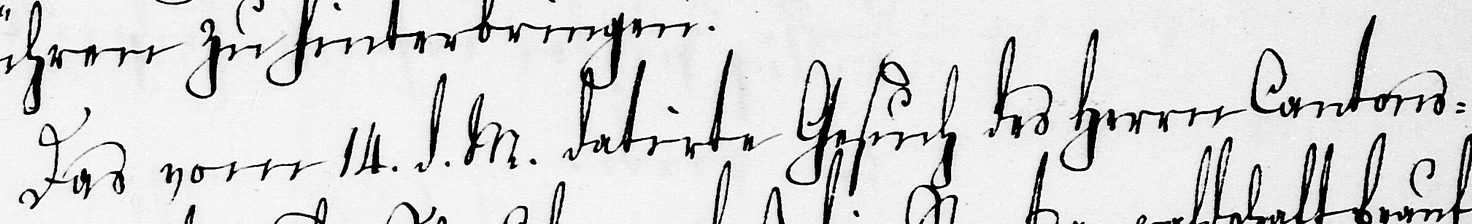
Das vom 14. d. M. datirte Gesuch des Herrn Cantos¬
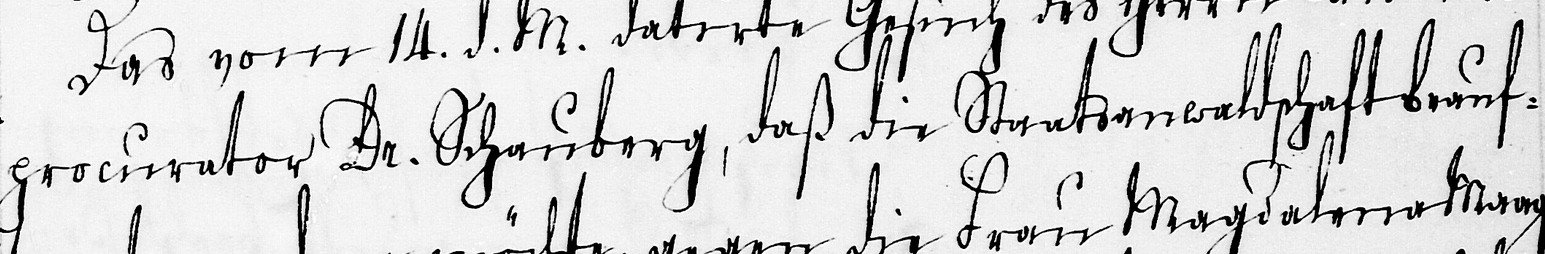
procurator Dr. Schauberg, daß die Staatsanwaldschaft beauf¬
